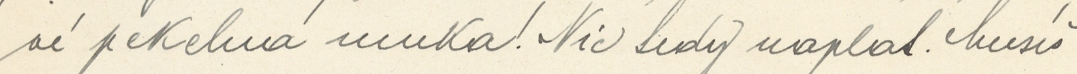ví pekelná muka! Nic tedy naplat. Musíš
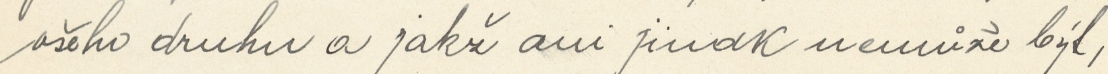všeho druhu a jakž ani jinak nemůže být,
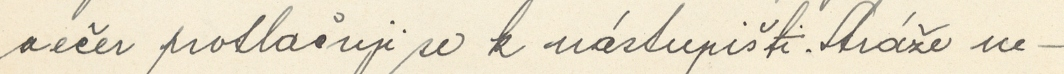večer protlačuji se k nástupišti. Stráže ne-
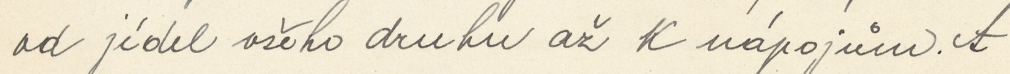od jídel všeho druhu až k nápojům. A
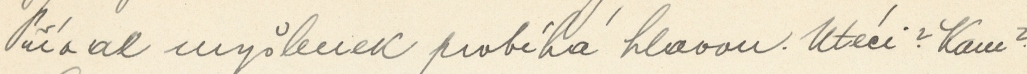Příval myšlenek probíhá hlavou. Utéci? Kam?
